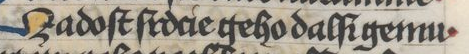Zadoſt ſrdcie geho dalſi gemu.
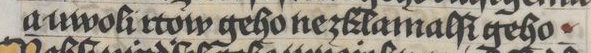a uwoli rtow geho nezklamalſi geho.
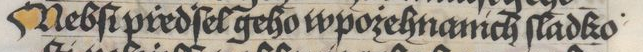Nebſi pṙedẛel geho w pożehnaních ſladko¬
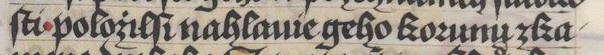ſti.polożilſi nahlavie geho korunu zka¬
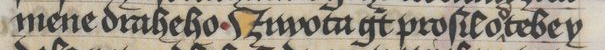mene draheho.Ziwota ḡt il od tebe y
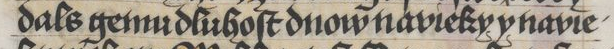dals gemu dluhoſt dnow navieky y navie¬
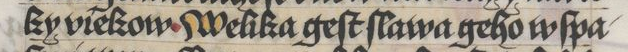ky viekow.Welika geſt ſlawa geho w ſpa¬
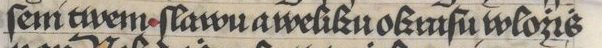ſení twem.ſlawu a weliku okraſu wlożiṡ
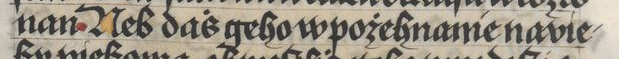nan.Neb daṡ geho w pożehnaníe navie¬
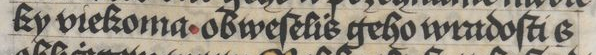ky viekoma.obweſeliṡ geho wradoſti s
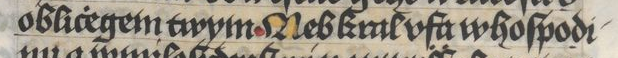obliċegem twym.Neb kral ufa whoſpodi¬
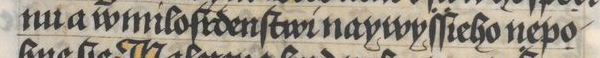nu a w miloſrdenſtwí naywyẛẛieho nepo¬
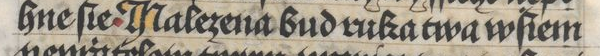hne ſie.Nalezena bud ruka twa wẛiem
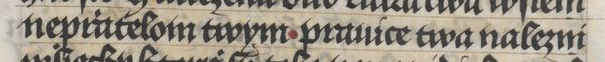nepṙatelom twym.pravice twa nalezni
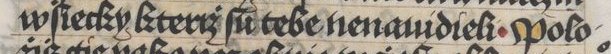wẛiecky kteriž ſu tebe nenavidieli.Polo¬
